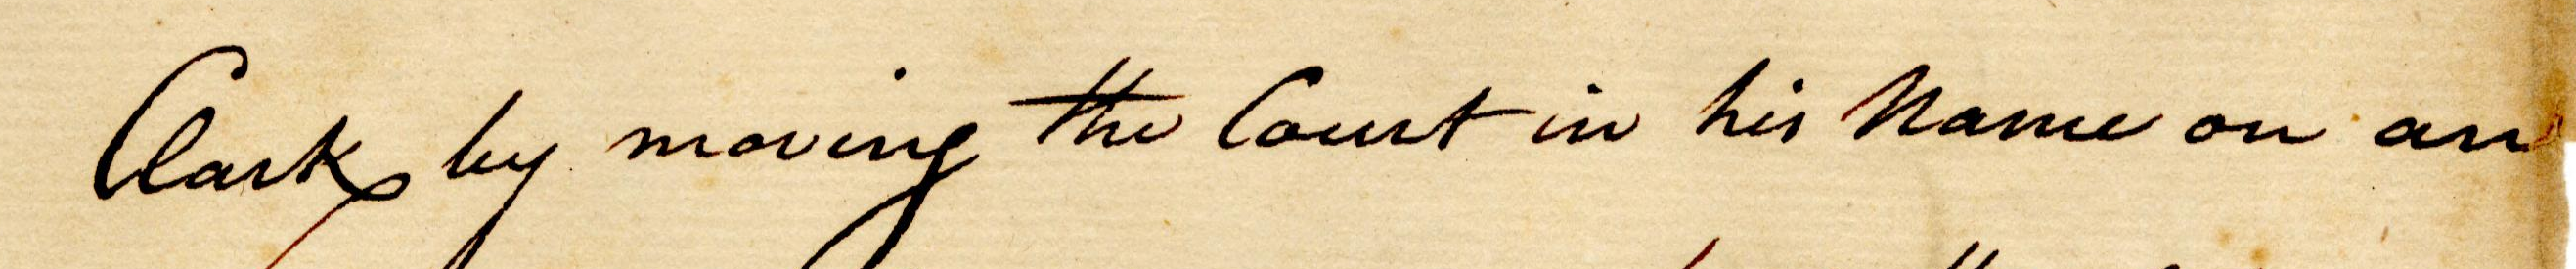Clark by moving the Court in his Name on an
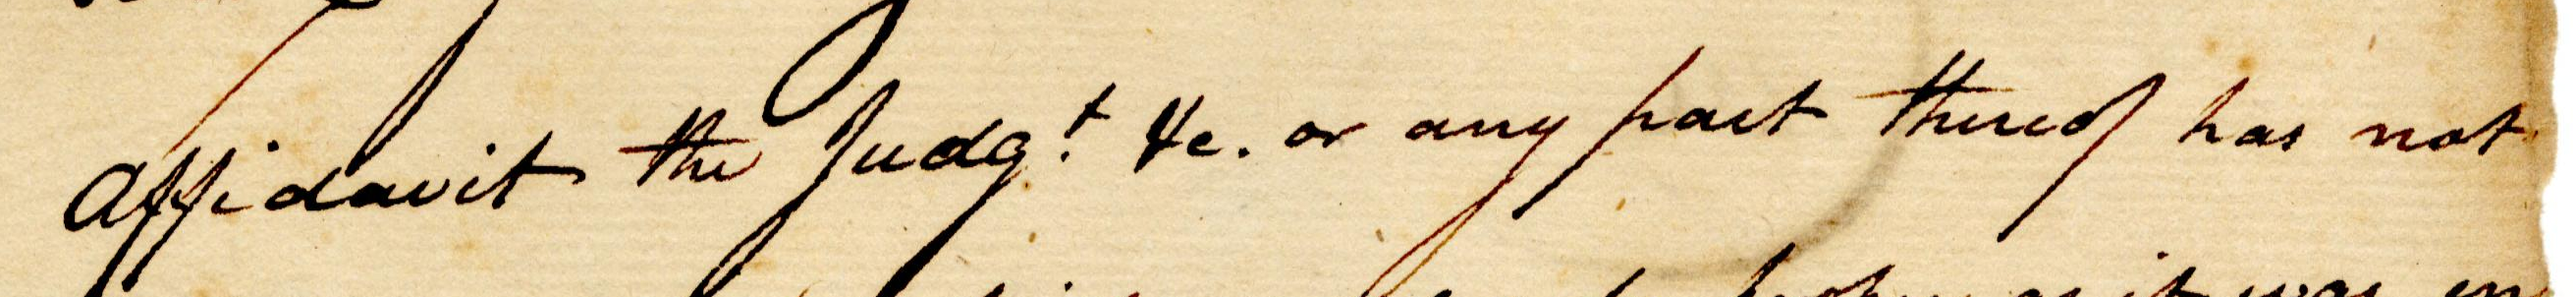affidavit the Judg^t &c. or any part thereof has not
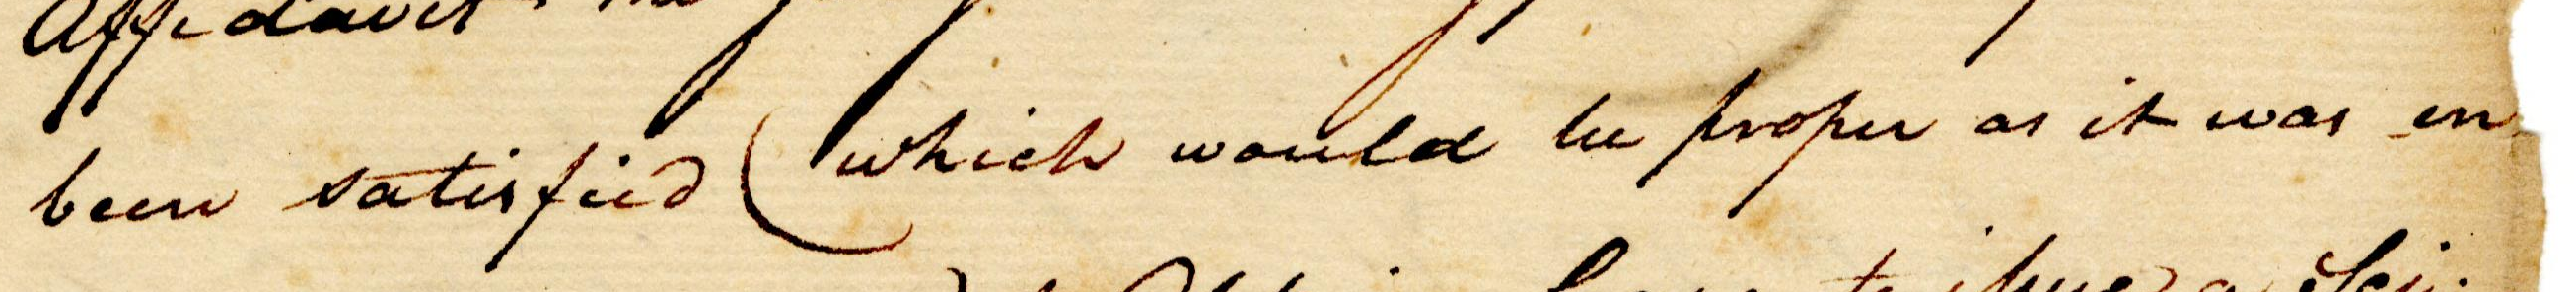been satisfied (which would be proper as it was en-
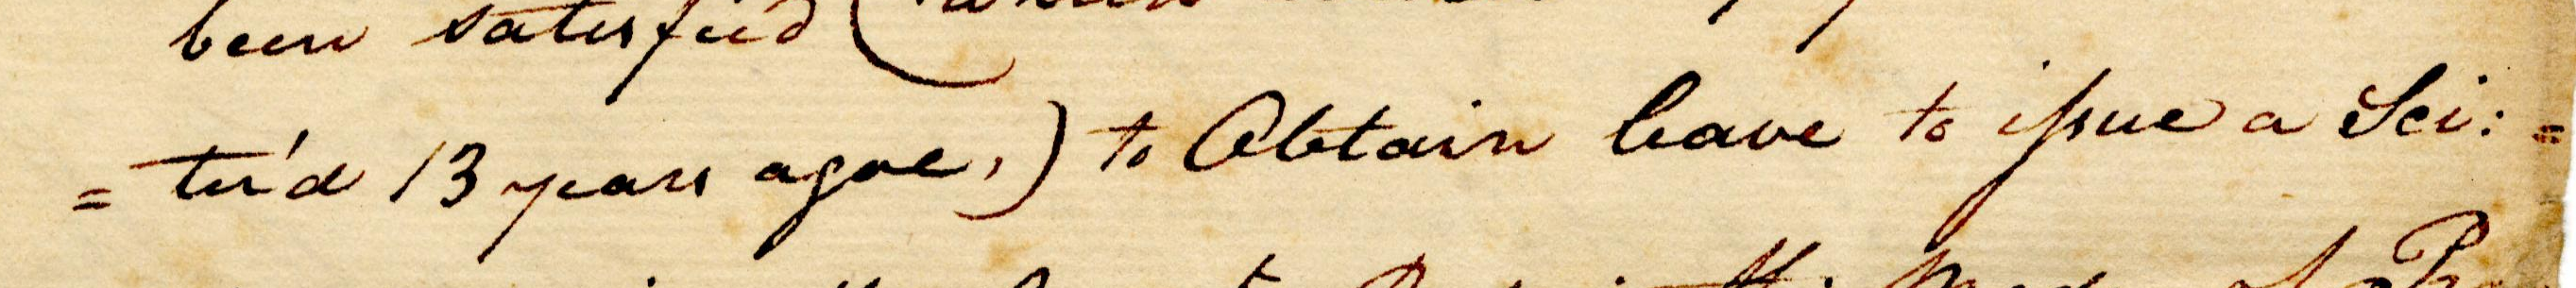-ter'd 13 years agoe) to obtain leave to issue a Sei-
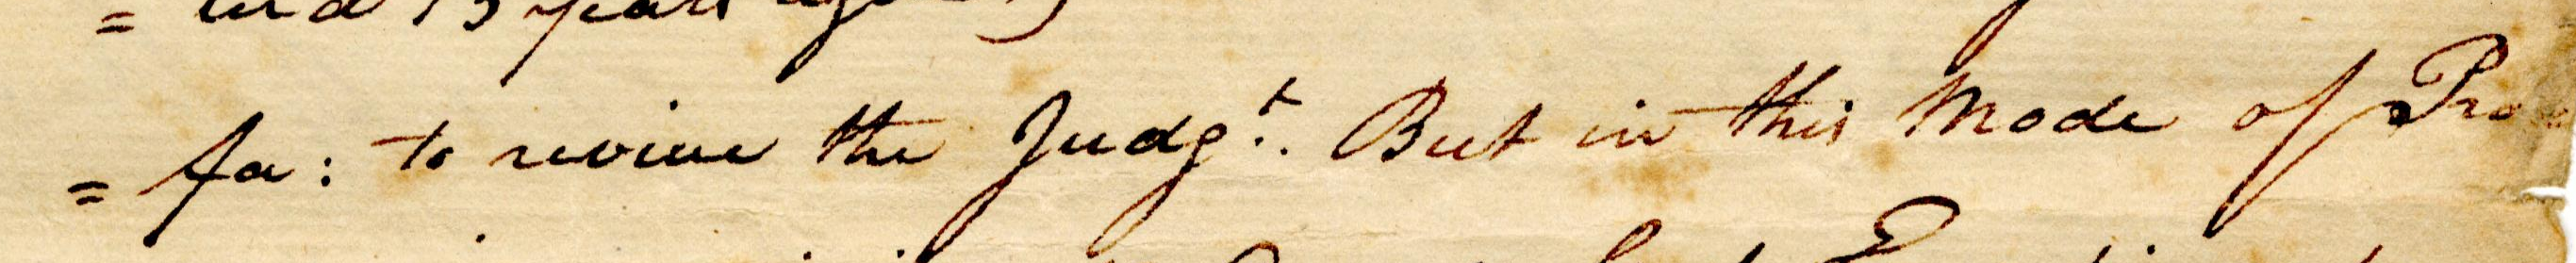-for: to revive the Judg^t. But in this mode of pro-
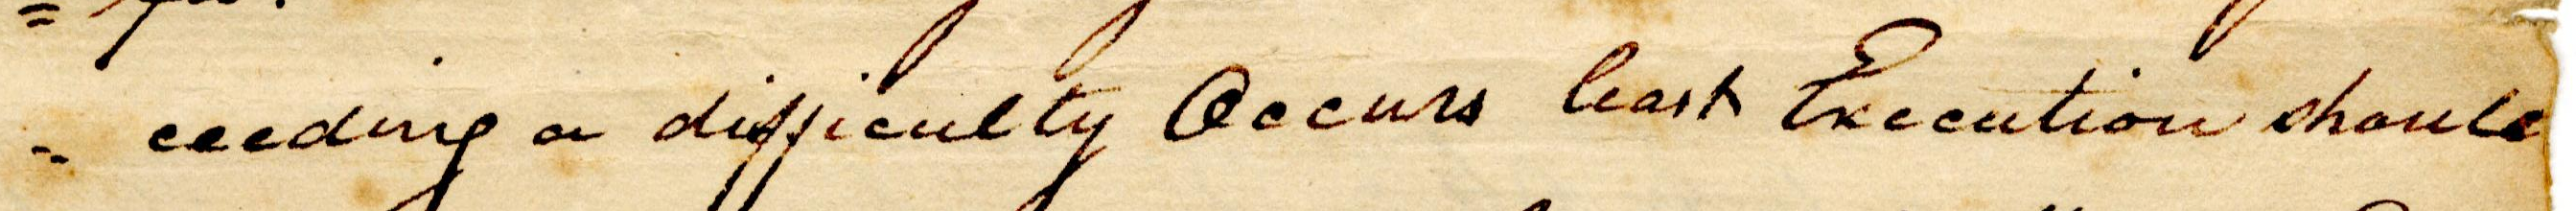-ceeding a difficulty occurs least Execution should
